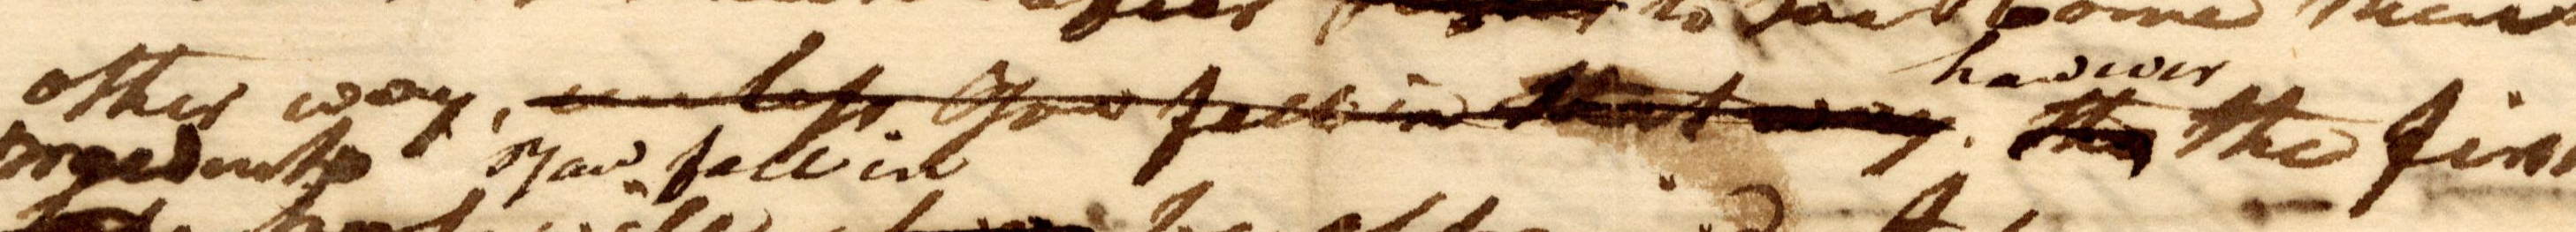other way, [unless you fell in that way]. [the] the first
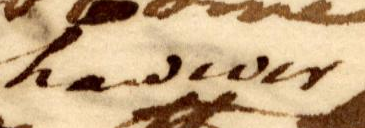however
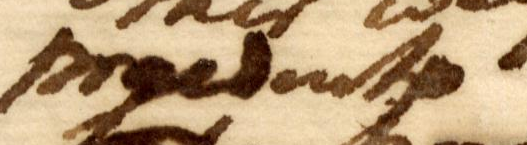prudent
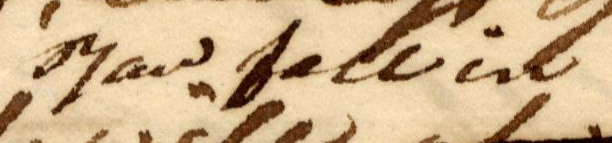you fell in
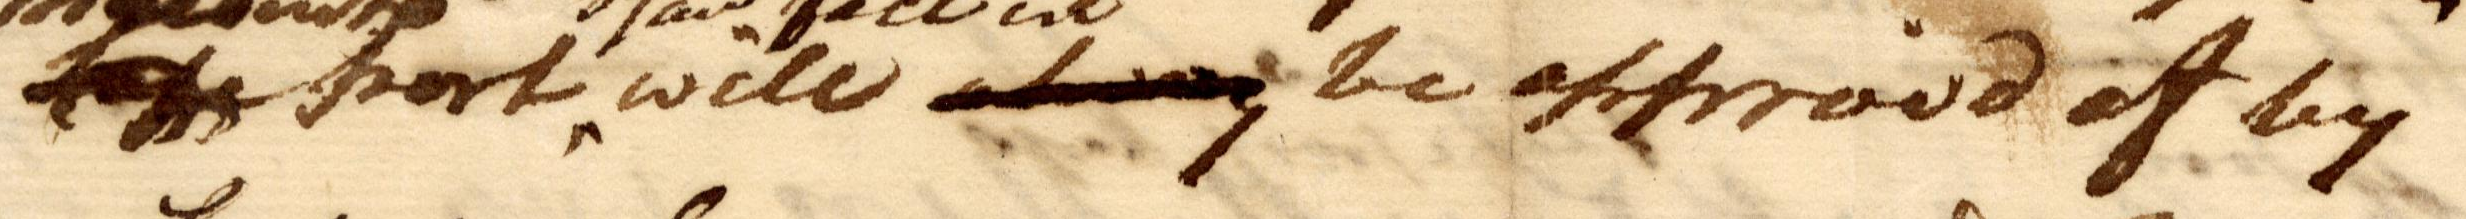[___] port ^ will [___] be approv'd of by
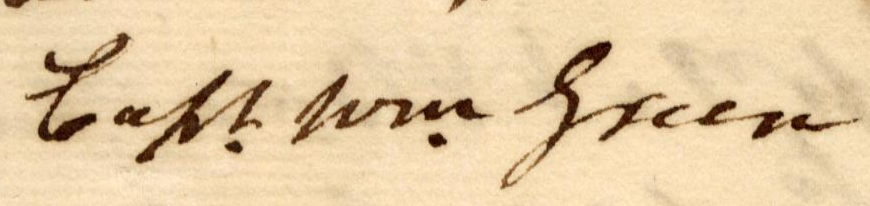Capt Wm Green
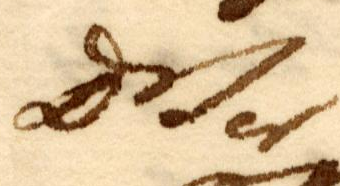D^r. Sir
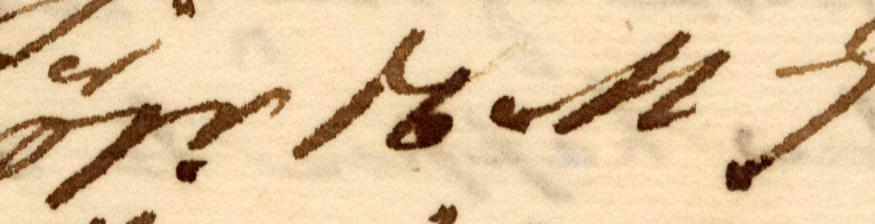Y^r Hum S
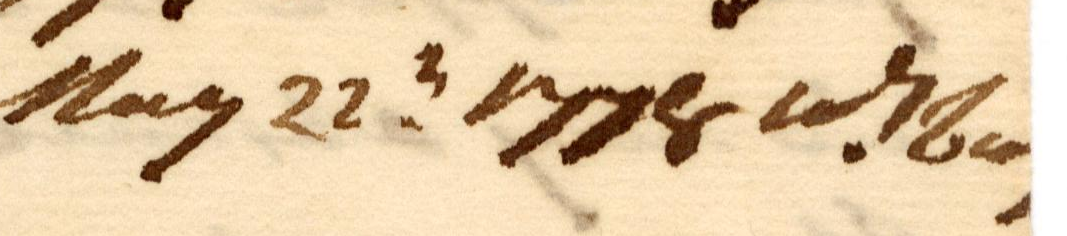May 22^d 1778 W^mbur
